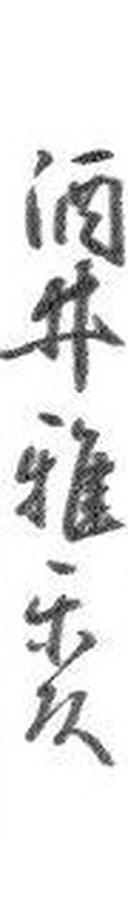酒井雅楽頭
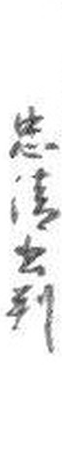忠清書判
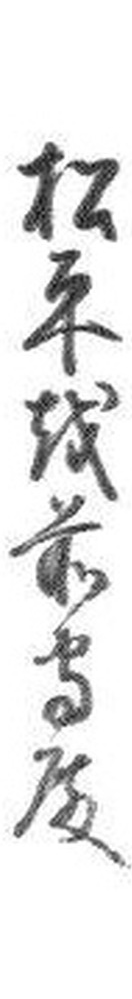松平越前守殿
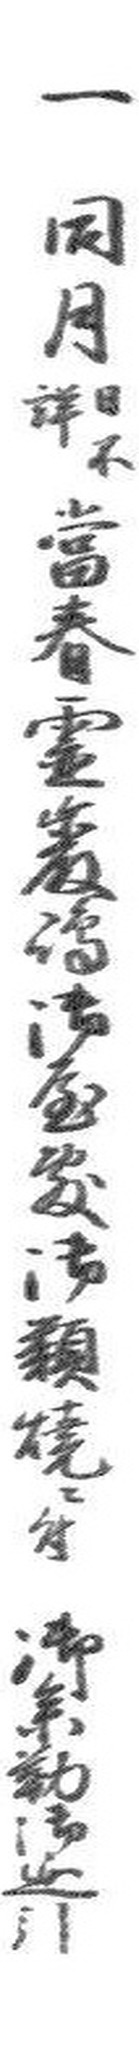一同月日不詳当春霊巌島御屋敷御類焼ニ付御参勤御延引
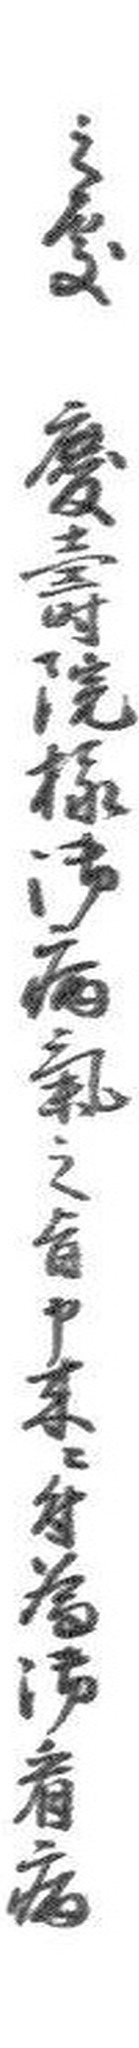之処慶寿院様御病気之旨申来ニ付為御看病

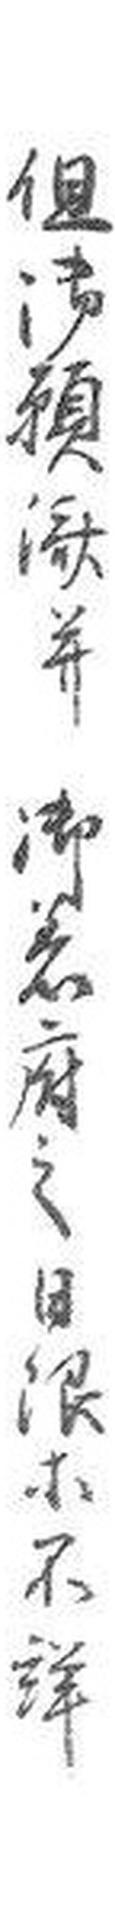但御願済并御着府之日限等不詳
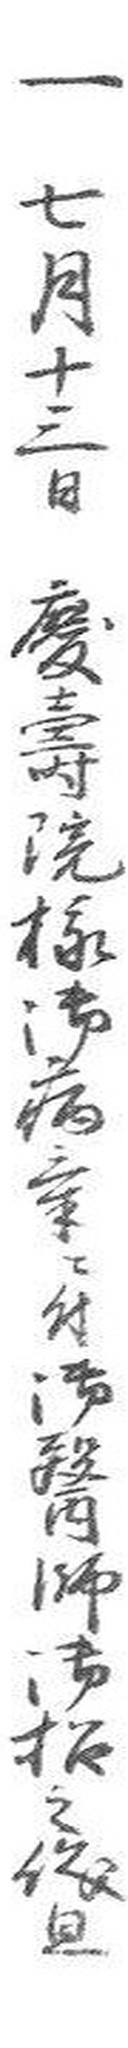一七月十三日慶寿院様御病気ニ付御医師御招之儀且
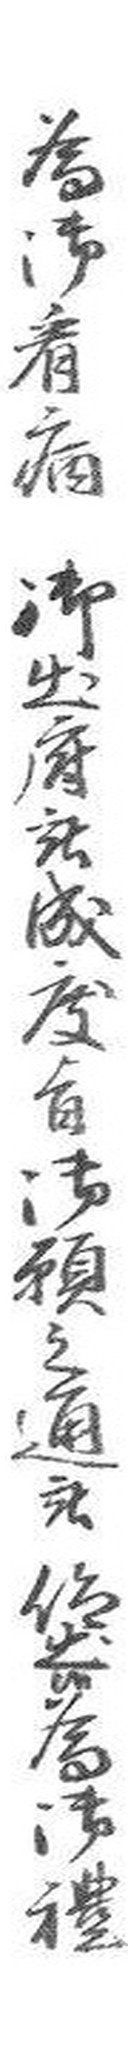為御看病御出府被成度旨御願之通被仰出候為御礼
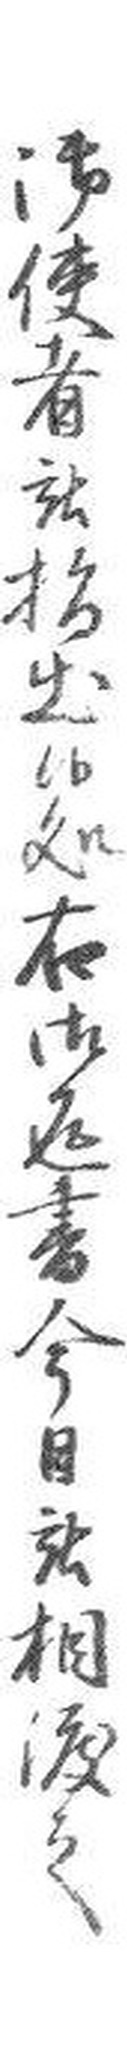御使者被指出候処右御返書今日被相渡之
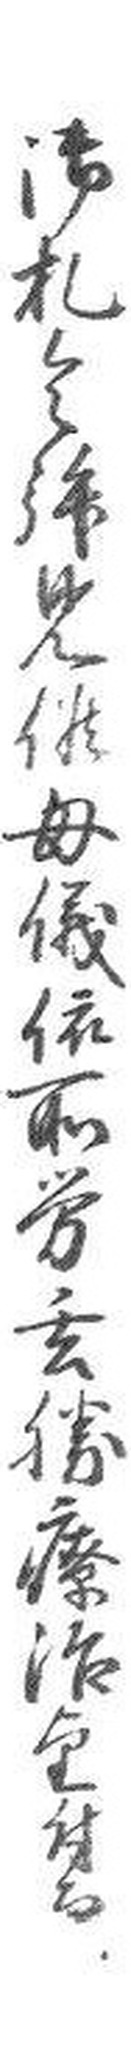御札令拝見候母儀依所労玄勝療治望付而
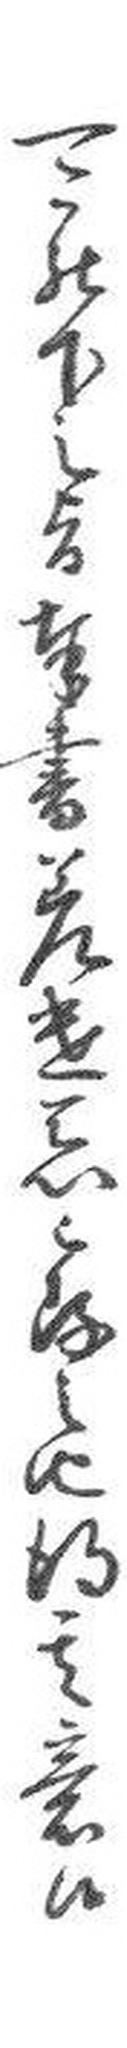可罷下之旨奉書差遣忝被存之由得其意候
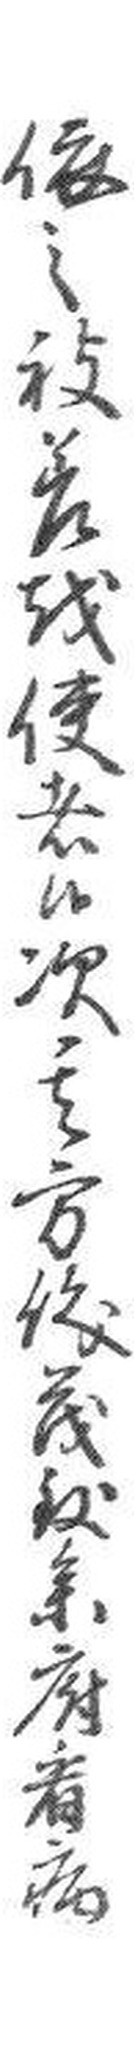依之被差越使者候次其方儀茂致参府看病
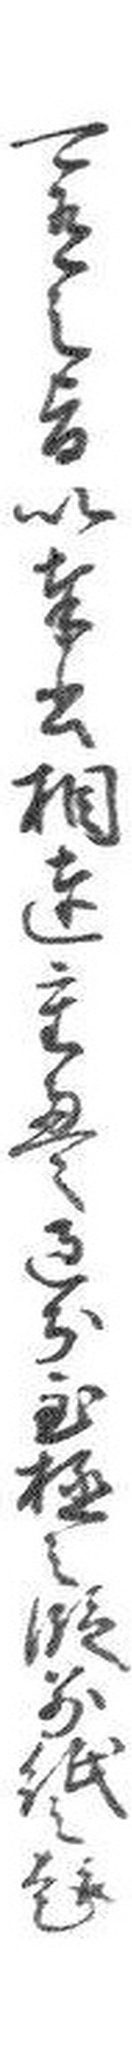可有之旨以奉書相達重畳過分至極之段別紙之趣
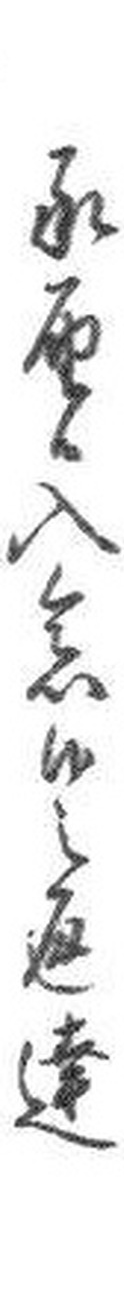承届候入念候之通達
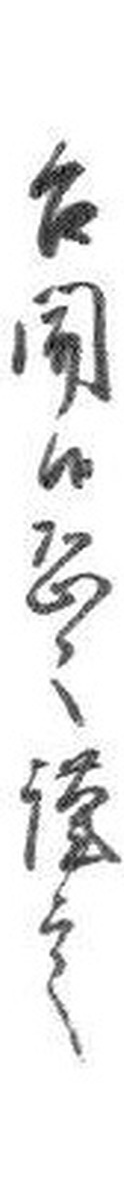召聞候恐々謹言
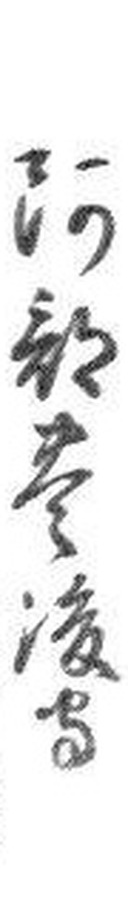阿部豊後守
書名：家譜 五 光通公 従寛永十三年到万治二年
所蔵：福井県文書館 Fukui Prefectural Archives
